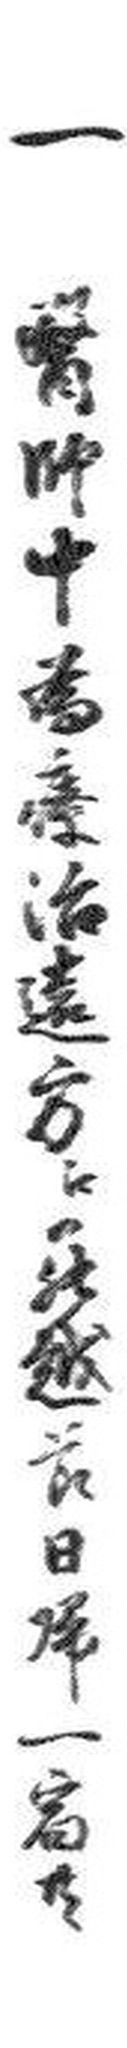一医師中為療治遠方江罷越節日帰一宿共
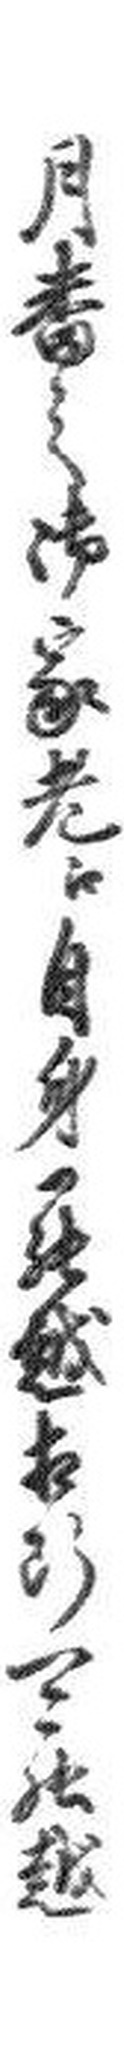月番之御家老江自身罷越相断可罷越

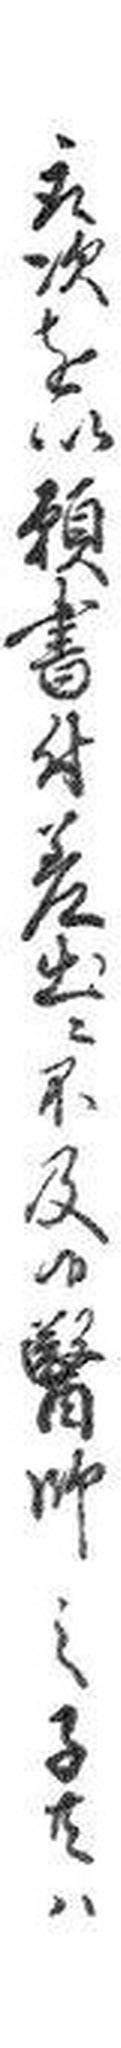取次を以願書付差出ニ不及候医師之子共ハ
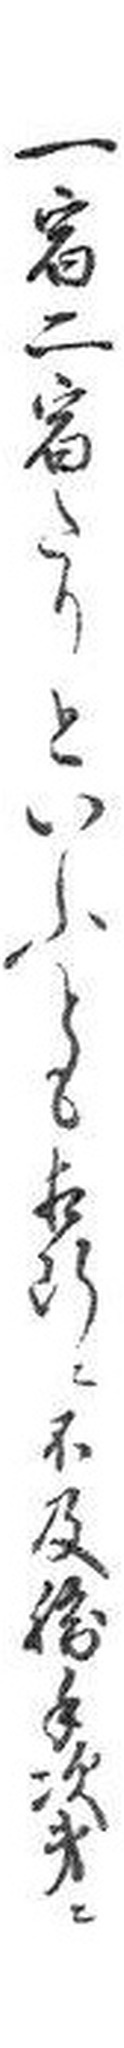一宿二宿たりといふとも相断ニ不及勝手次第ニ
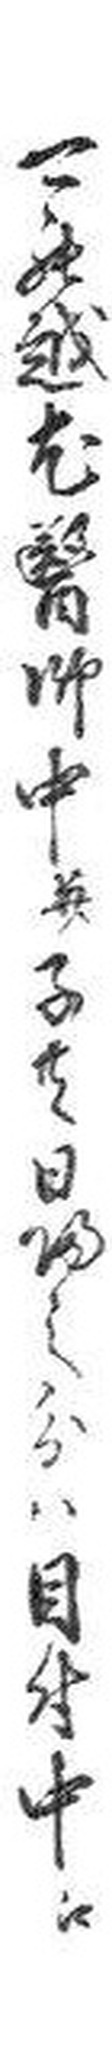可罷越尤医師中并子共日帰之分ハ目付中江
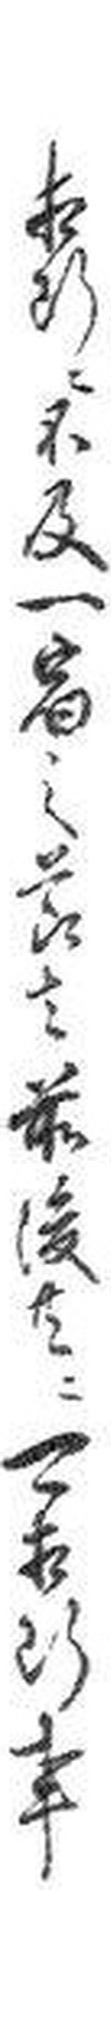相断ニ不及一宿之節者前後共ニ可相断事
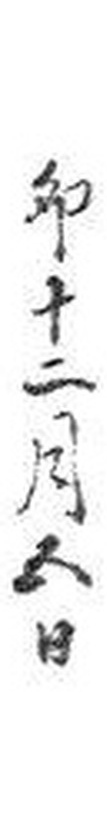卯十二月五日
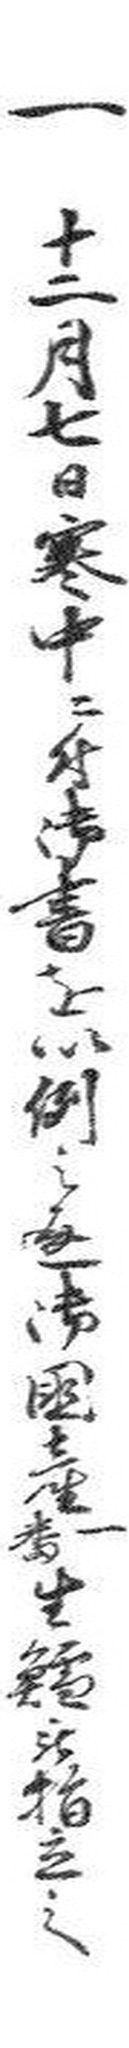一十二月七日寒中ニ付御書を以例之通御国産一番生鱈被指立之
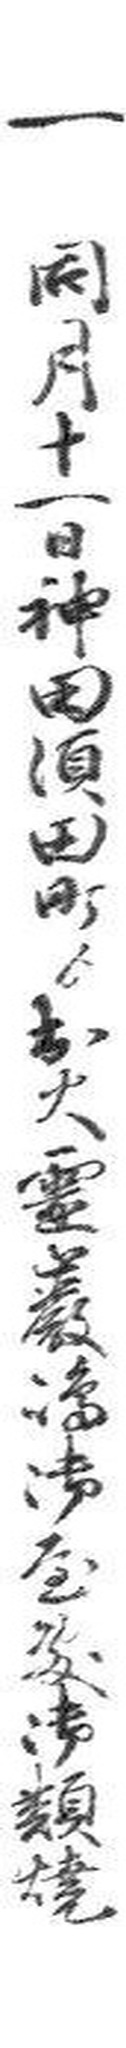一同月十一日神田須田町ゟ出火霊巌島御屋敷御類焼
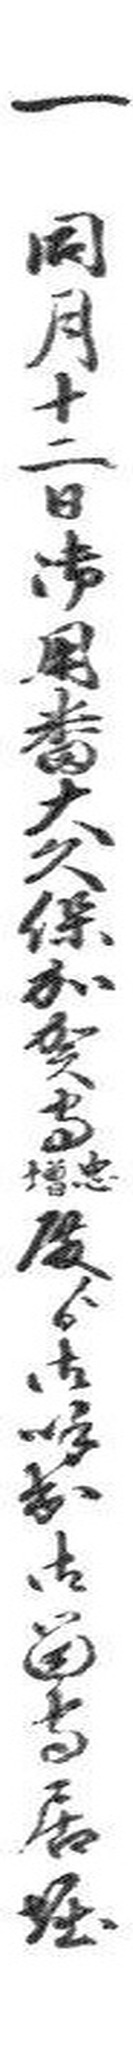一同月十二日御用番大久保加賀守忠増殿ゟ御呼出御留守居堀
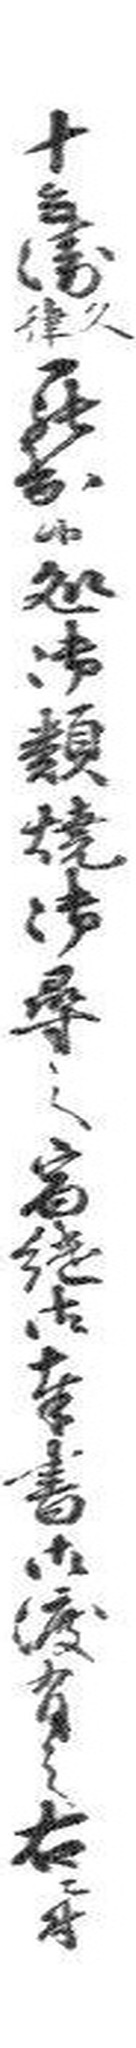十兵衛久律罷出候処御類焼御尋之宿継御奉書御渡有之右ニ付
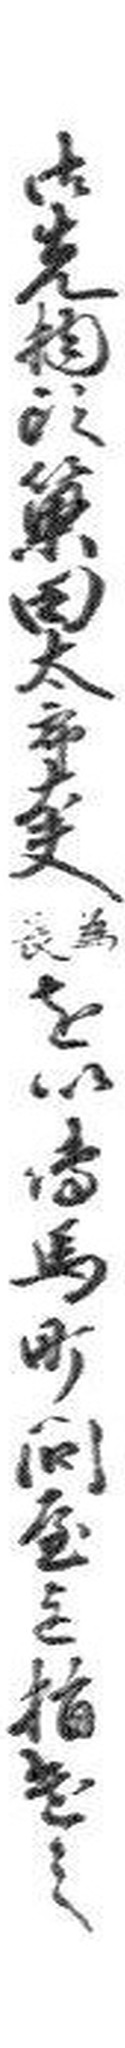御先物頭簗田太郎大夫為長を以伝馬町問屋迄指遣之
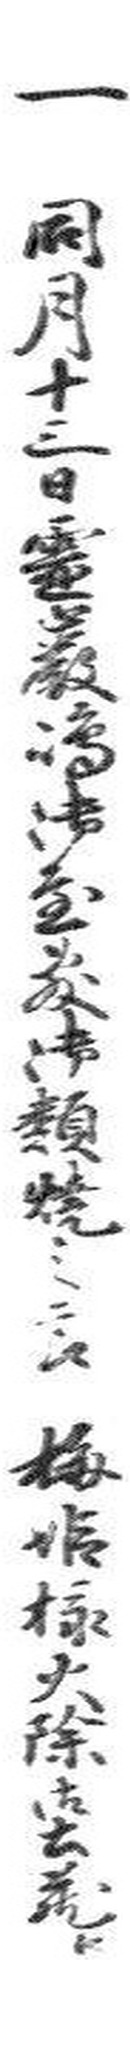一同月十三日霊巌島御屋敷御類焼之節梅姫様火除御土蔵江
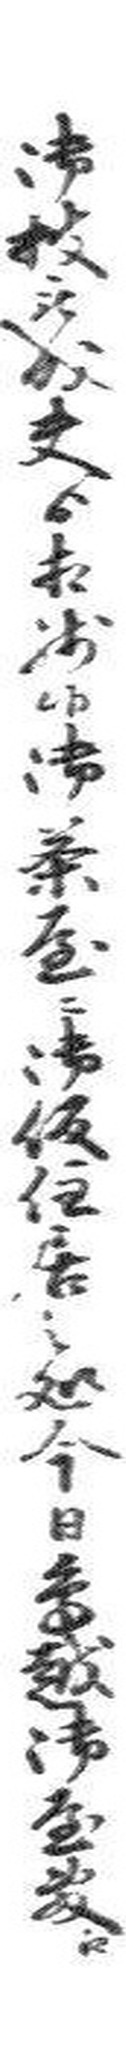御披被成夫ゟ相残候御茶屋ニ御仮住居之処今日鳥越御屋敷江
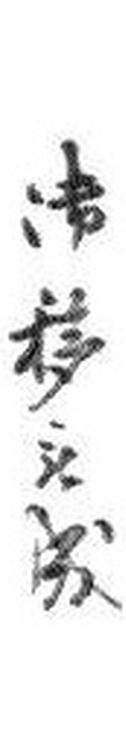御移被成
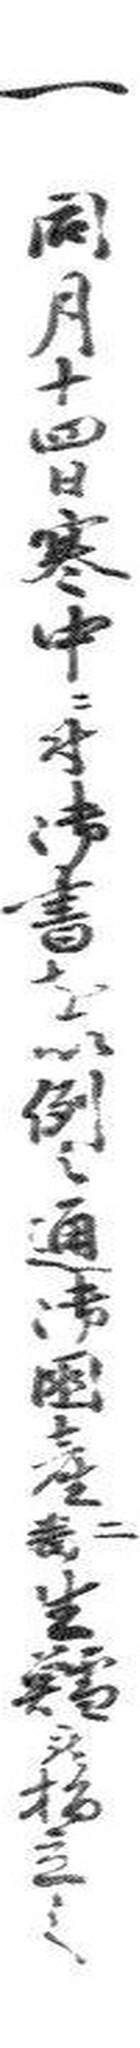一同月十四日寒中ニ付御書を以例之通御国産二番生鱈被指立之
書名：家譜 二十八 吉邦公 従宝永七年七月五日到正徳元年十二月
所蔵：福井県文書館 Fukui Prefectural Archives
